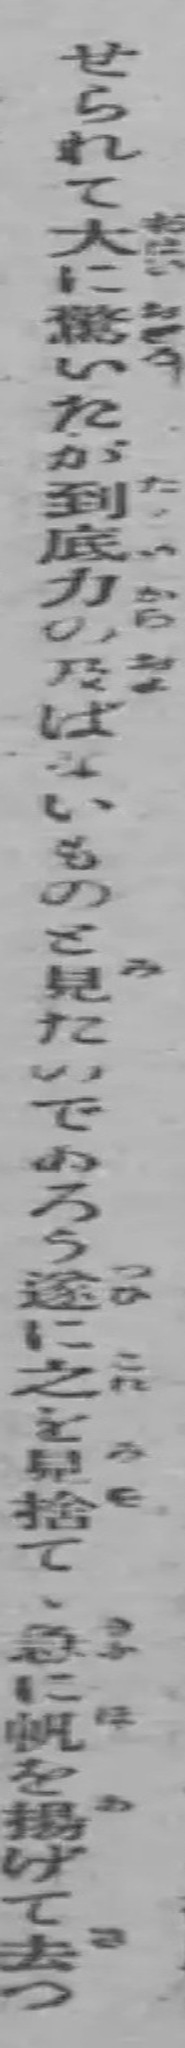せられて大に驚いたが到底力の及ばないものと見たのであろう遂に之を見捨てゝ急に帆を揚げて去つ
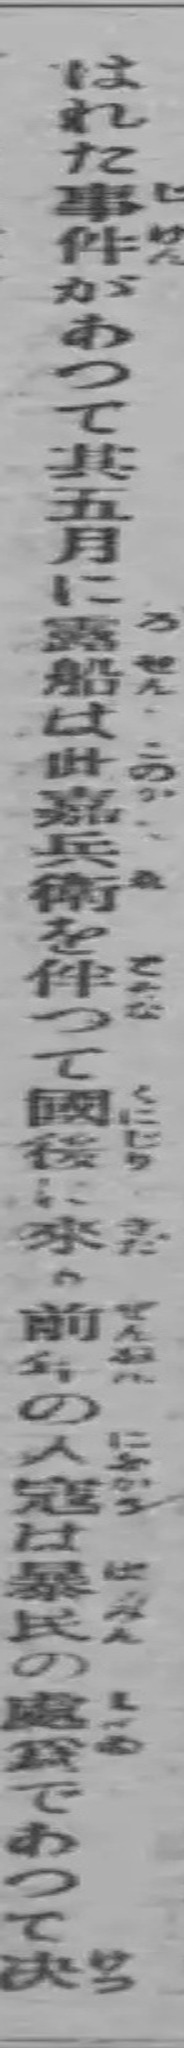はれた事件があつて其五月に露船は此嘉兵衛を伴つて国後に来り前年の入寇は暴民の処為であつて決
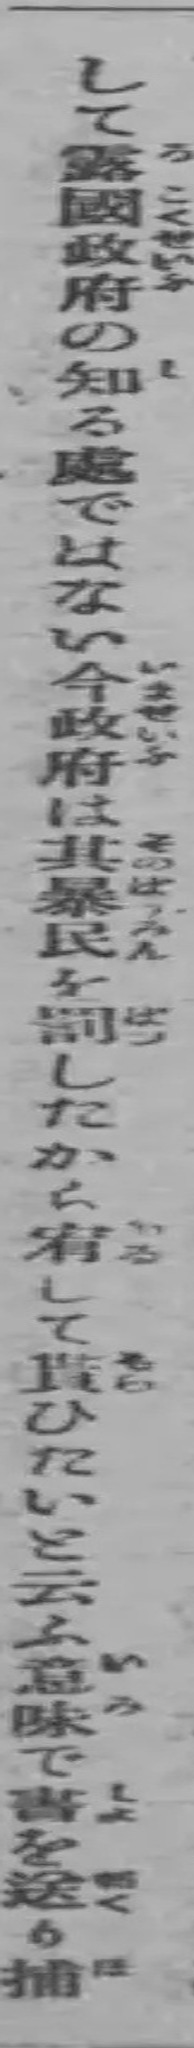して露国政府の知る処ではない今政府は其暴民を罰したから宥して貰ひたいと云ふ意味で書を送り捕
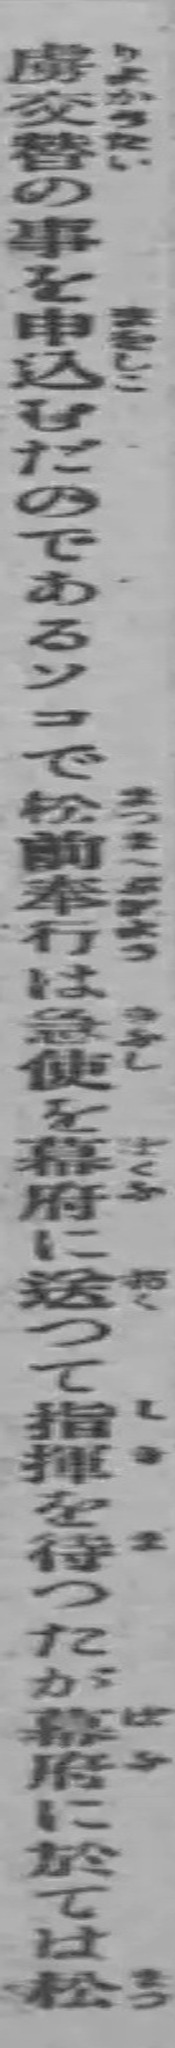虜交替の事を申込むだのであるソコで松前奉行は急使を幕府に送つて指揮を待つたが幕府に於ては松
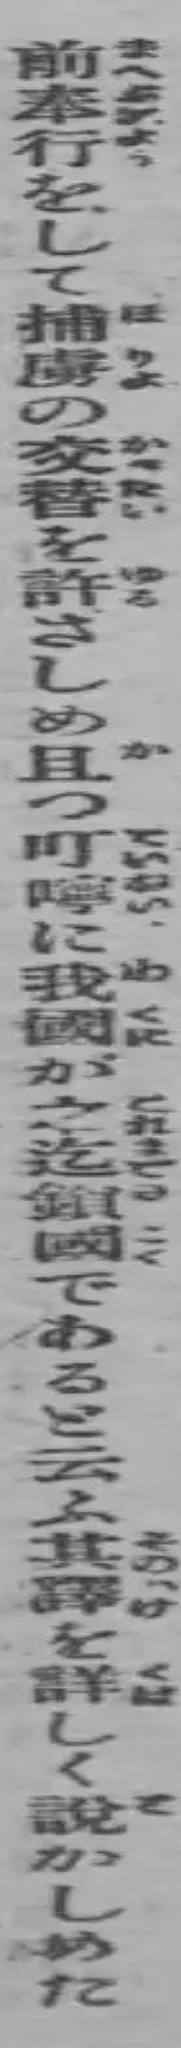前奉行をして捕虜の交替を許さしめ且つ叮嚀に我国が之迄鎖国であると云ふ其訳を詳しく説かしめた
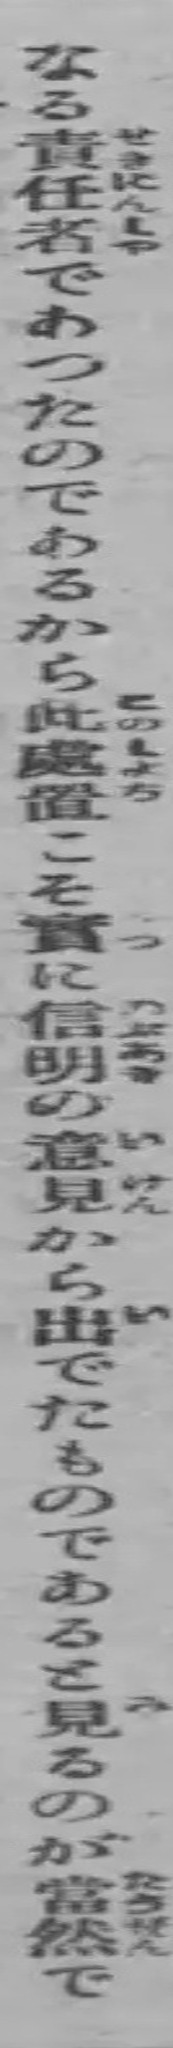なる責任者であつたのであるから此処置こそ実に信明の意見から出でたものであると見るのが当然で
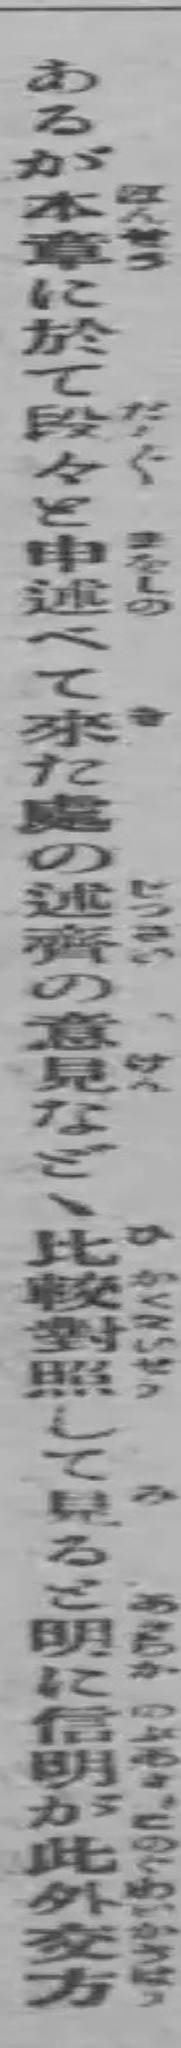あるが本章に於て段々と申述べて来た処の述斉の意見などゝ比較対照して見ると明に信明が此外交方
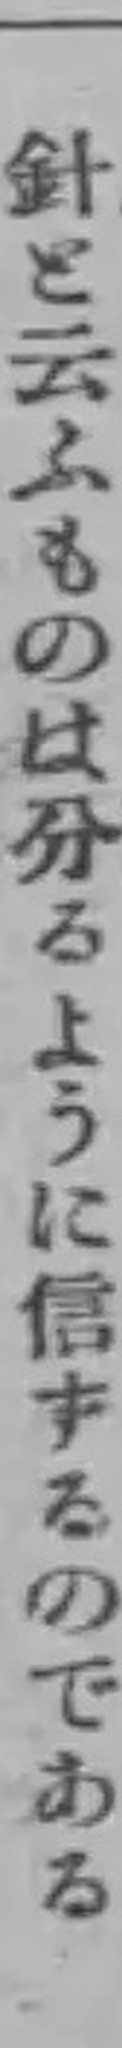針と云ふものは分るように信ずるのである
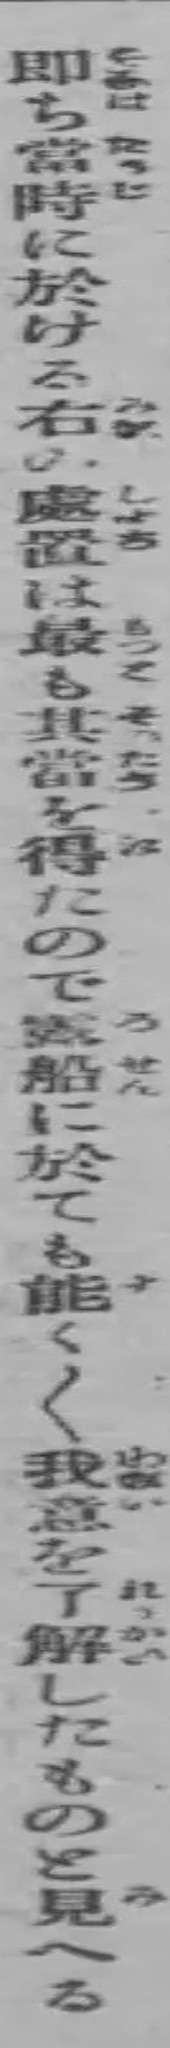即ち当時に於ける右の処置は最も其当を得たので露船に於ても能く〳〵我意を了解したものと見へる
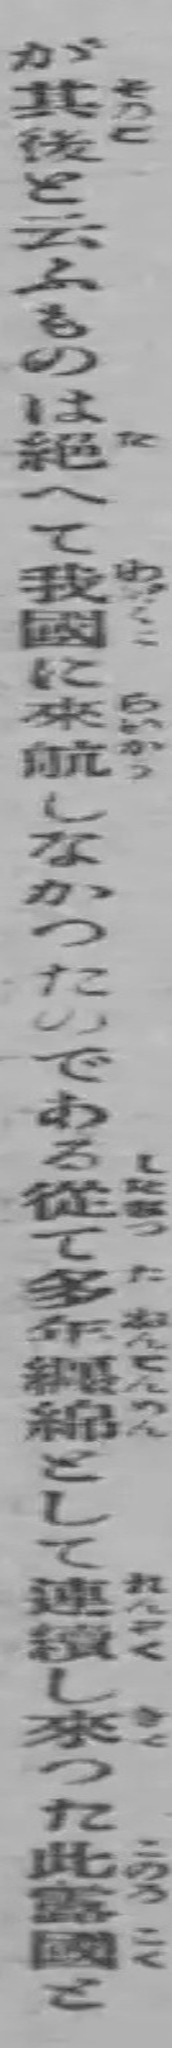が其後と云ふものは絶へて我国に来航しなかつたのである従て多年纏綿として連続し来つた此露国と
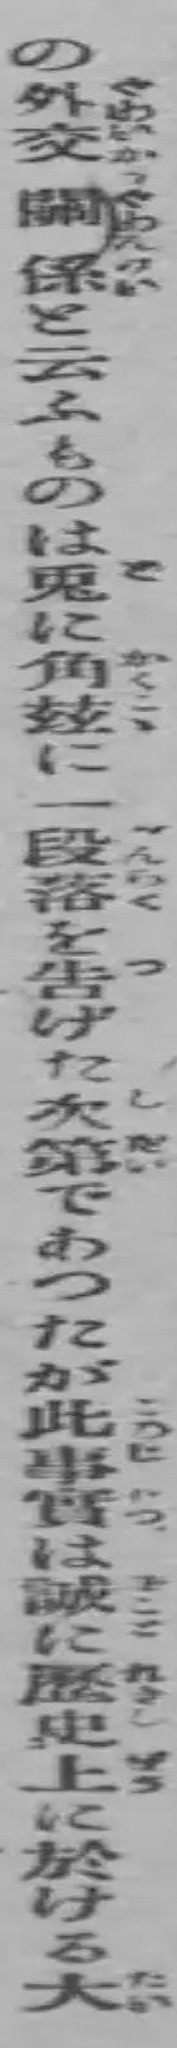の外交関係と云ふものは兎に角茲に一段落を告げた次第であつたが此事実は誠に歴史上に於ける大
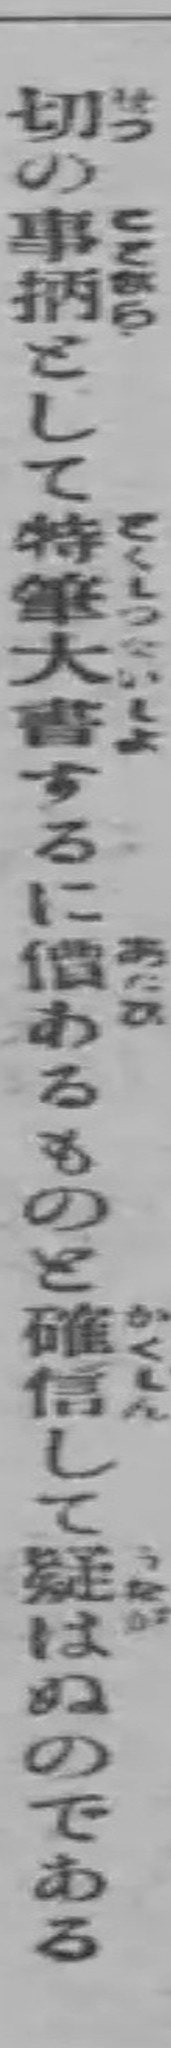切の事柄として特筆大書するに価あるものと確信して疑はぬのである
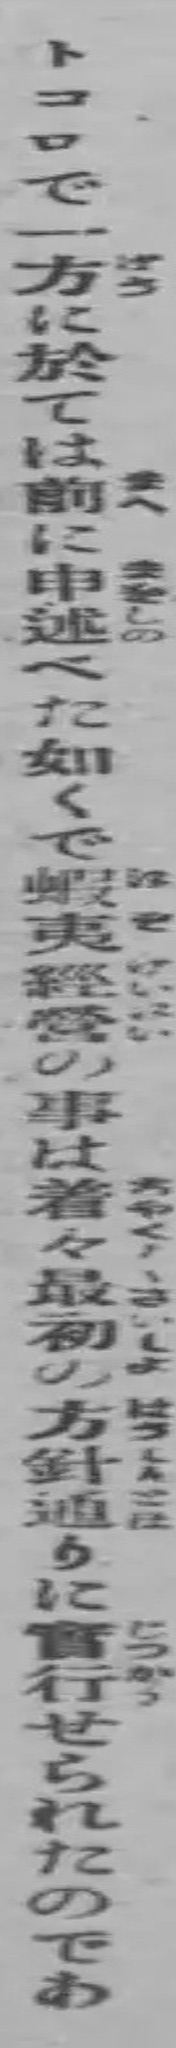北海の警備トコロで一方に於ては前に申述べた如くで蝦夷経営の事は着々最初の方針通りに実行せられたのであ
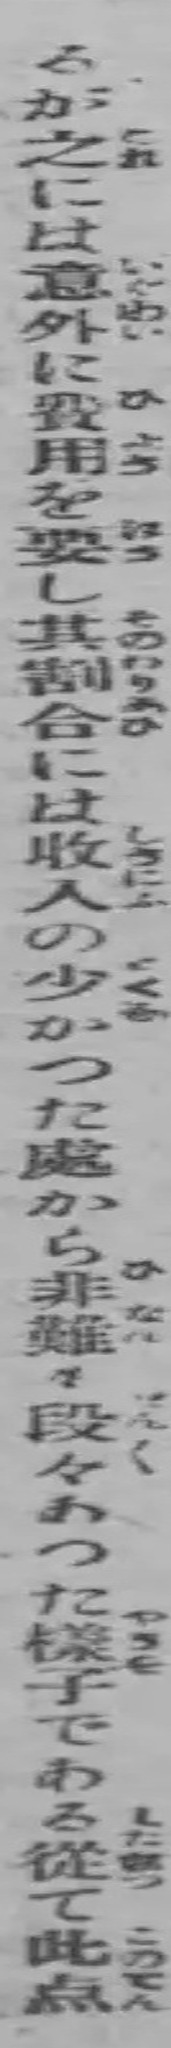るが之には意外に費用を要し其割合には収入の少かつた処から非難も段々あつた様子である従て此点
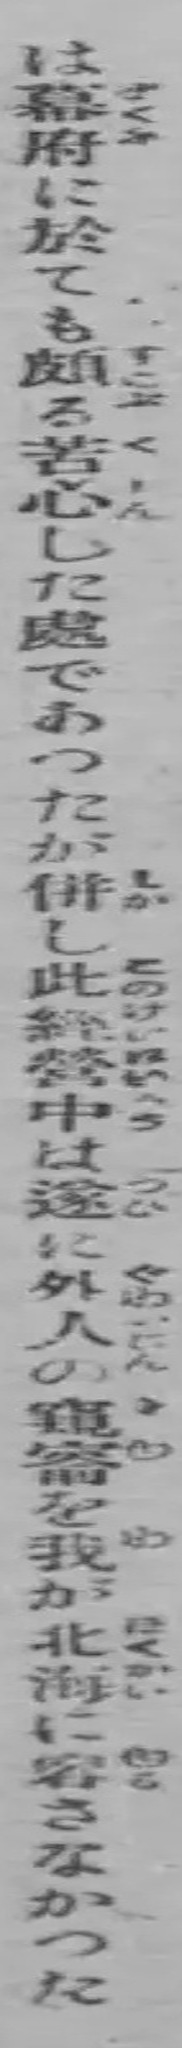は幕府に於ても頗る苦心した処であつたが併し此経営中は遂に外人の窺窬を我が北海に容さなかつた
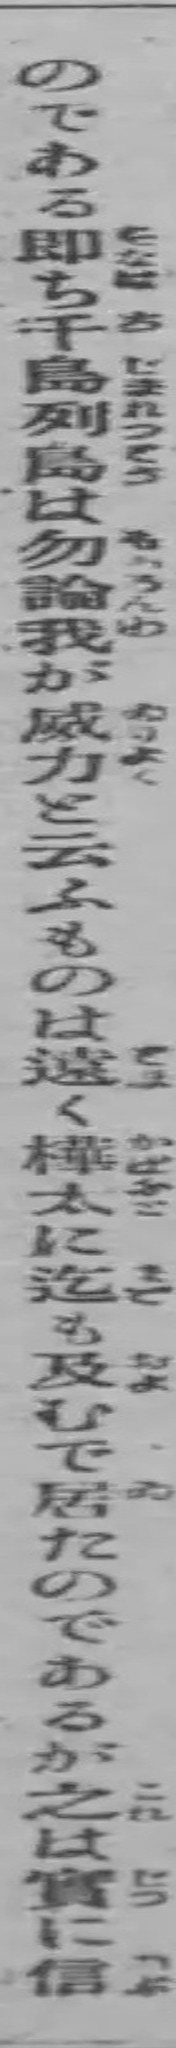のである即ち千島列島は勿論我が威力と云ふものは遠く樺太に迄も及むで居たのであるが之は実に信
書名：豊橋市史談
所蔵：国立国会図書館 National Diet Library, JAPAN
